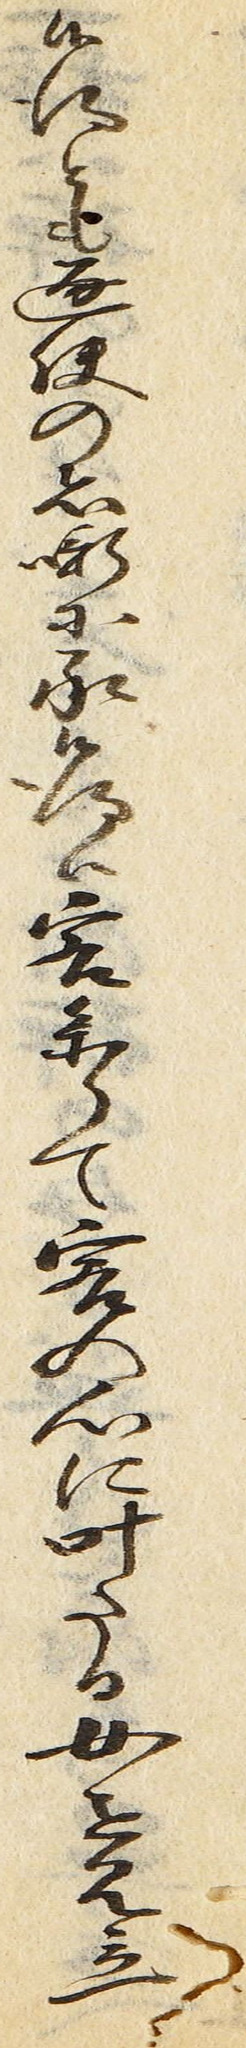候得とも通使の者噺に承候得は客集りて客の心に叶たる女を見立
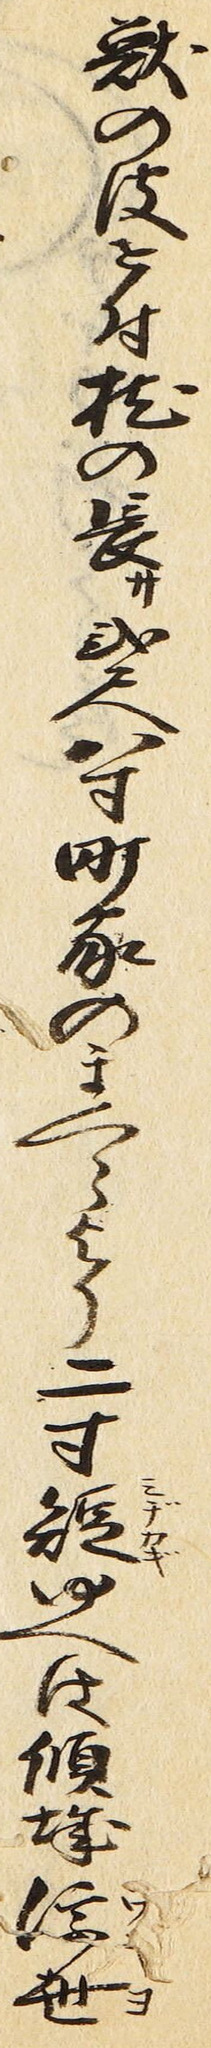獣の皮を付枕の長さ弐尺八寸町家のまくらより二寸短ゆへは傾城浮世
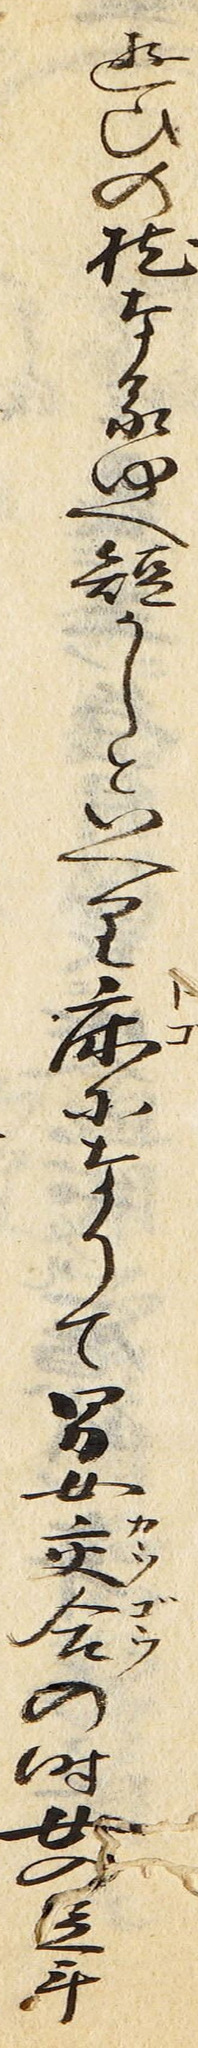遊ひの枕なるゆへ短かしといへり床になりて男女交合の時女の立計
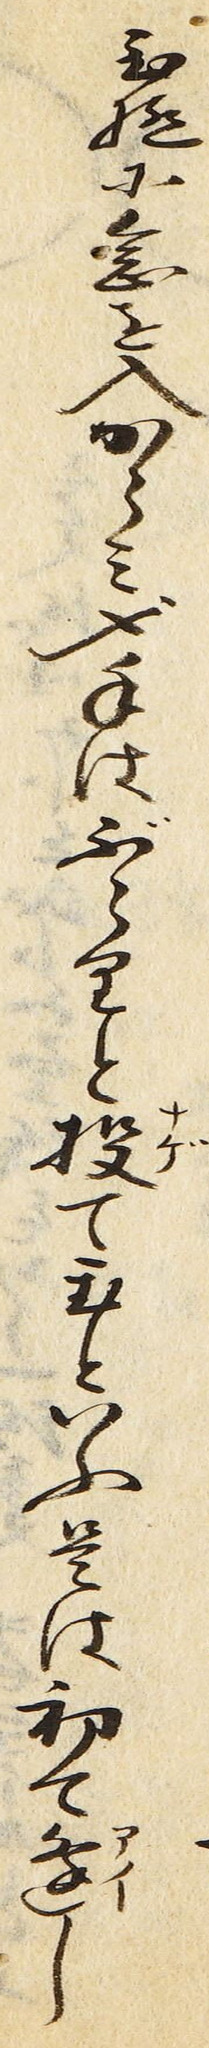至程に念を入からみ〆手はぶらり投て置といふ是は初て逢し
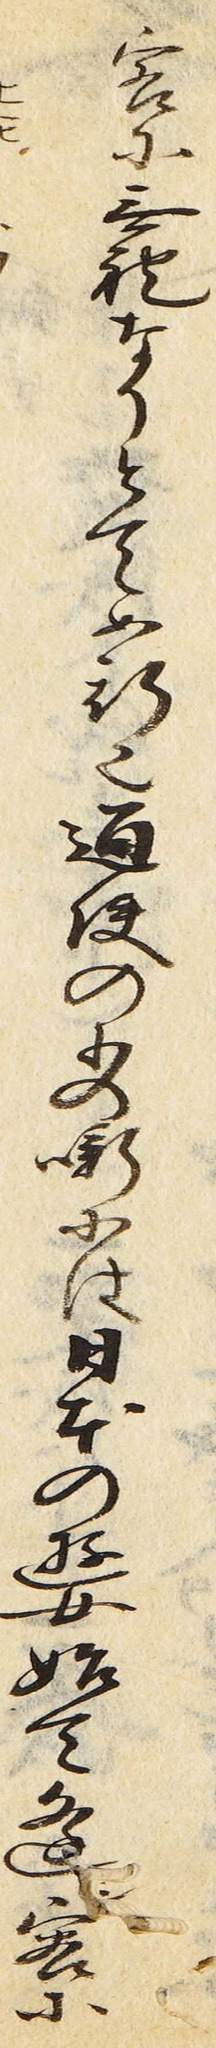客に無礼なりとて如斯也通使のもの噺には日本の遊女始て逢し客に
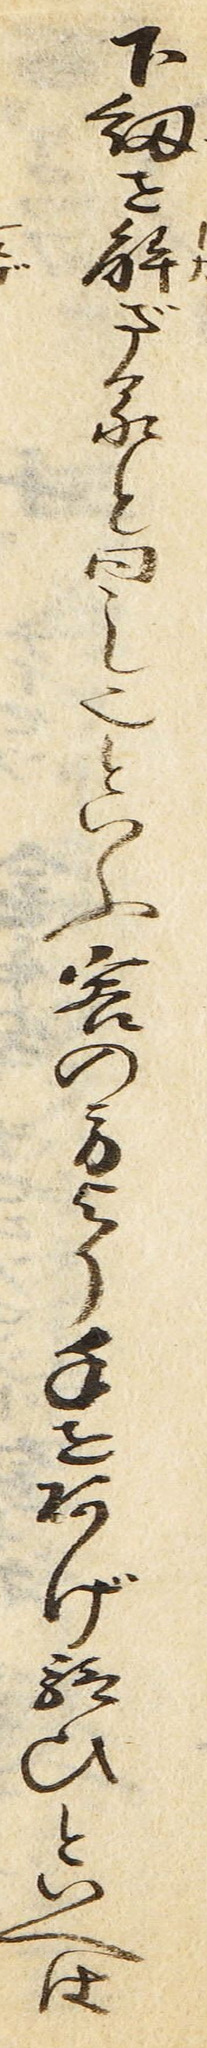下紐を解ざると同し也といふ客の方より手をあげ給ひといへは
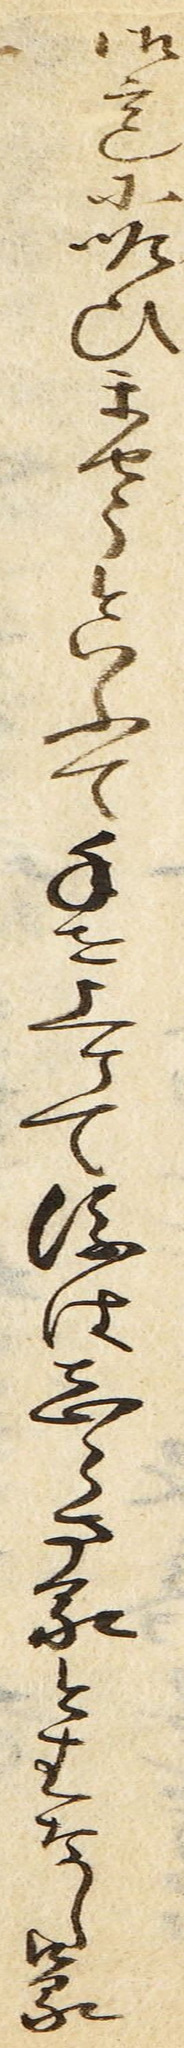御意に順ひませうといふて手を上ヶて後はしらさるとはなしける
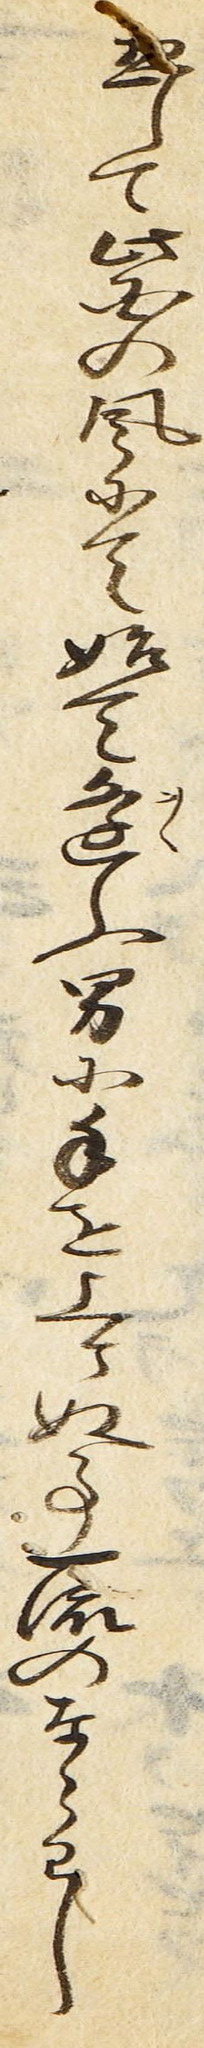惣して此国の風にて始て逢ふ男に手を上ヶぬ事一流のならわし
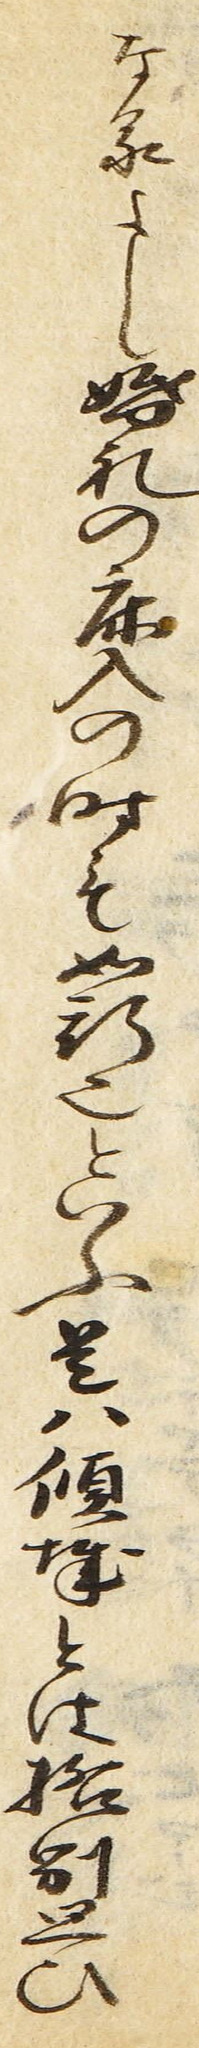なるよし婚礼の床入の時も如斯也といふ是は傾城とは格別思ひ
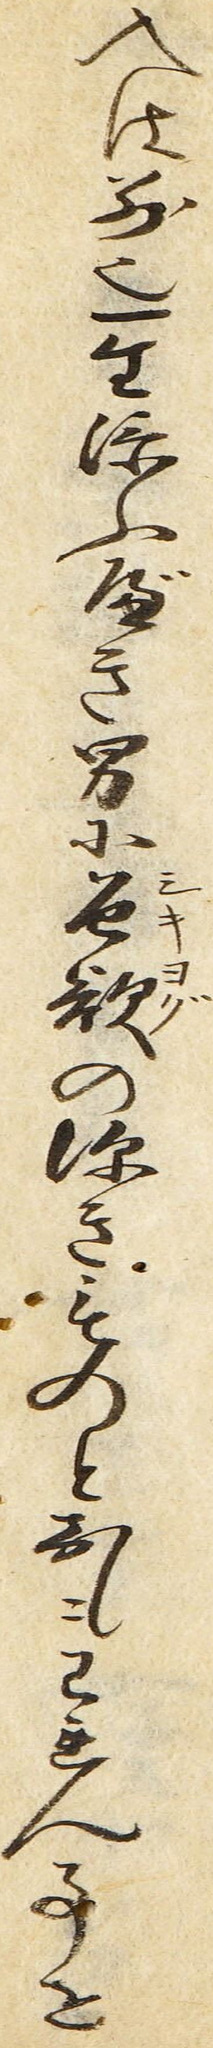入は別也一生添ふべき男に色欲の深きものとおもわれん事を
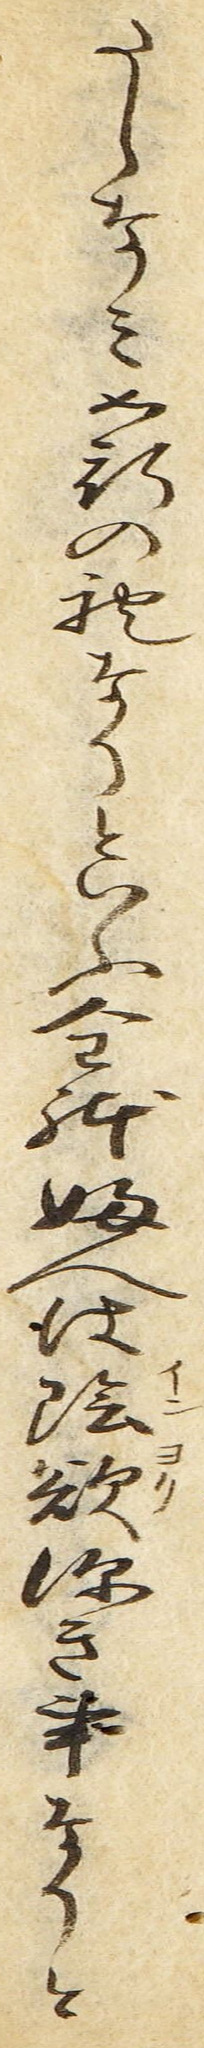たしなみ如斯の礼なりといふ全躰婦人は陰欲深き事なりと

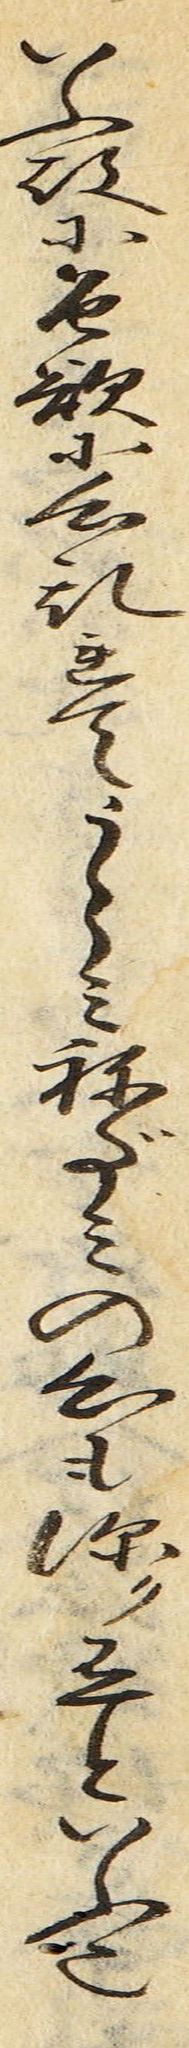いふ故に色欲に心乱れてうらみねだみの心も深く有といふ也
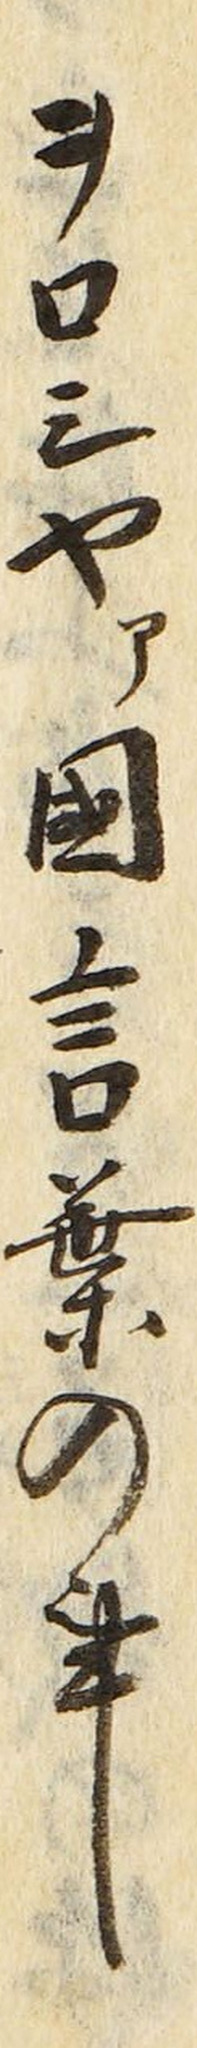ヲロシヤァ国言葉の事
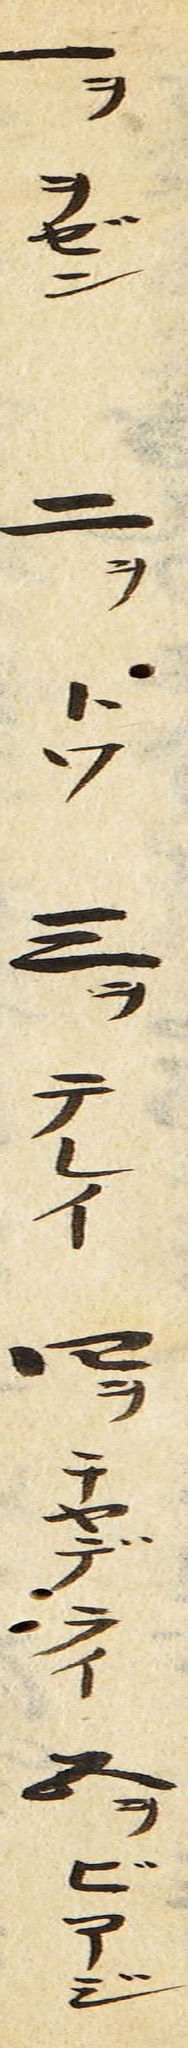一をヲゼン二をトワ三をテレイ四をチヤデライ五ヲビアジ
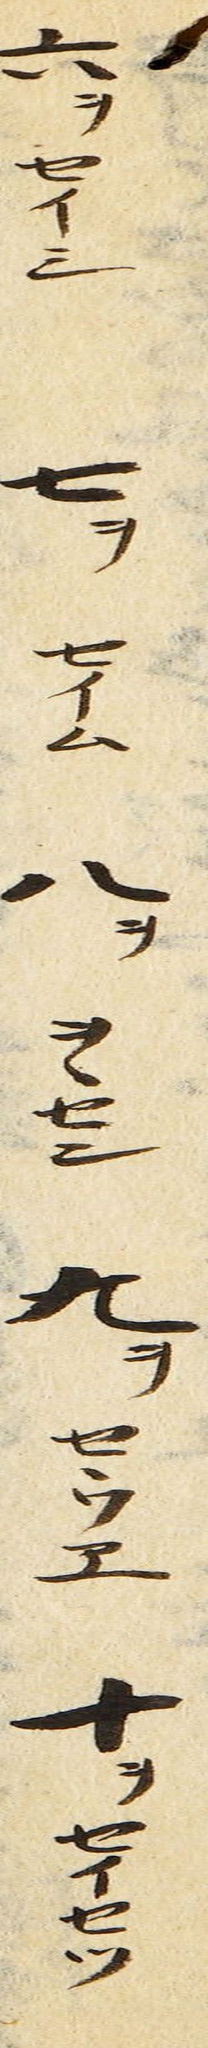六ヲセイシ七ヲセイム八ヲヲヽセン九ヲセウエ十ヲセイセツ
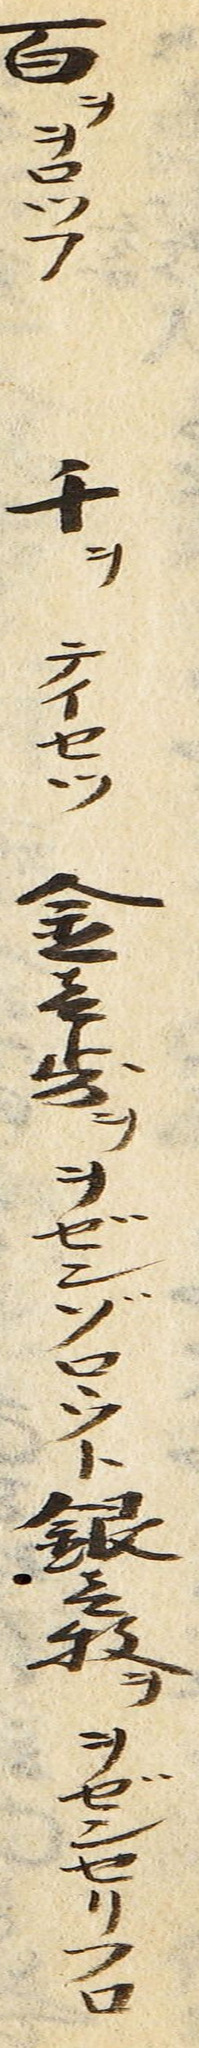百ヲヲロツフ千ヲテイセツ金壱歩ヲヲゼンゾロウト銀壱枚ヲヲゼンセリフロ
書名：外国漂流記
